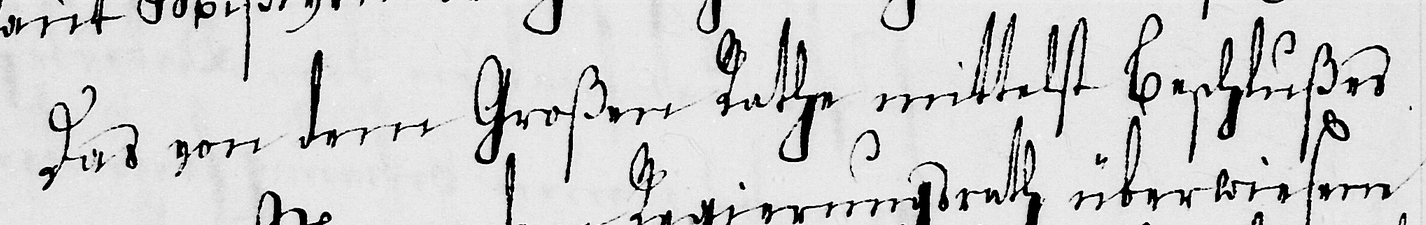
Das von dem Großen Rathe mittelst Beschlußes
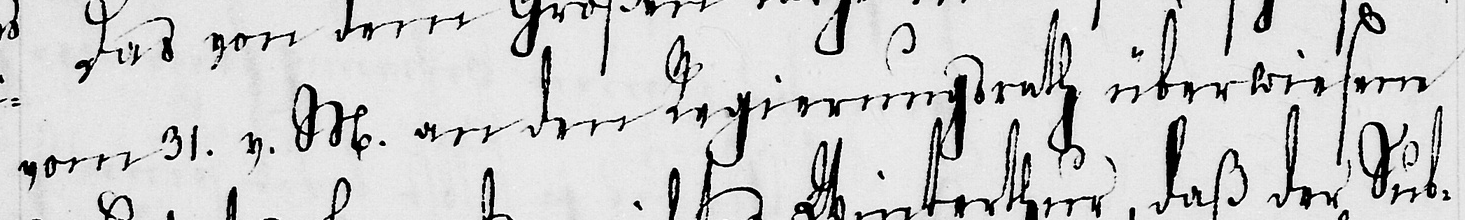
vom 31. v. M. an den Regierungsrath überwiesene
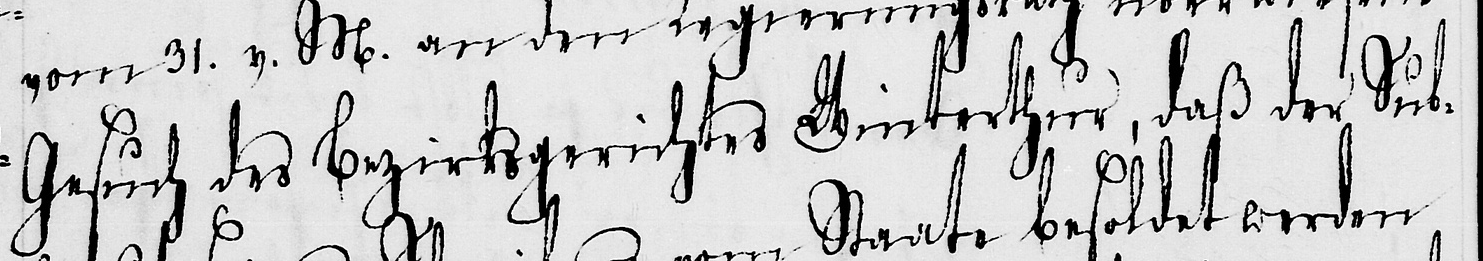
Gesuch des Bezirksgerichtes Winterthur, daß der Sub¬
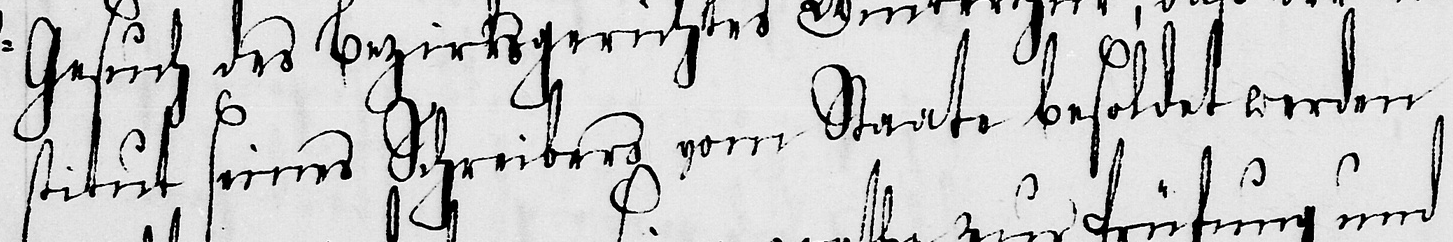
stitut seines Schreibers vom Staate besoldet werden
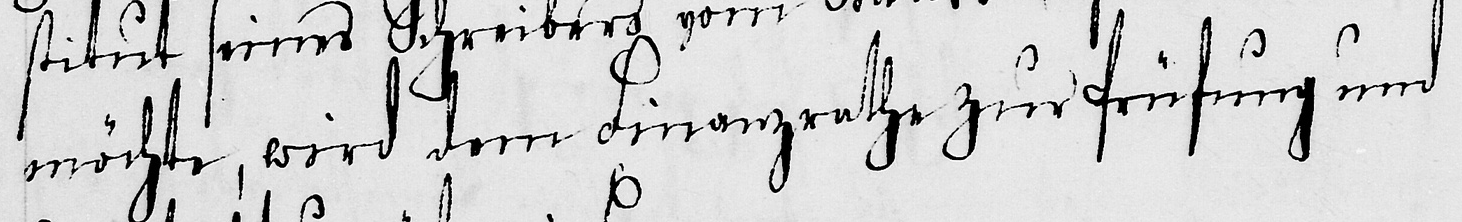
möchte, wird dem Finanzrathe zur Prüfung und
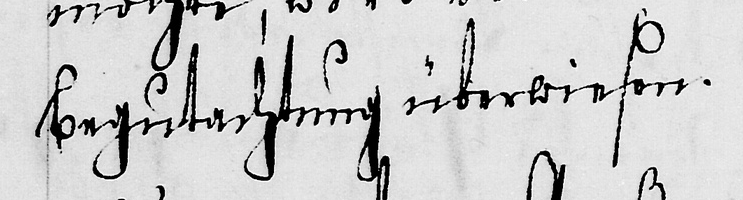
Begutachtung überwiesen.
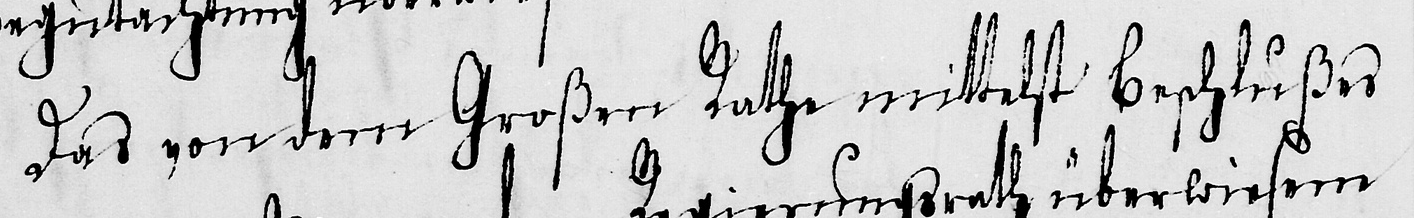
Das von dem Großen Rathe mittelst Beschlußes
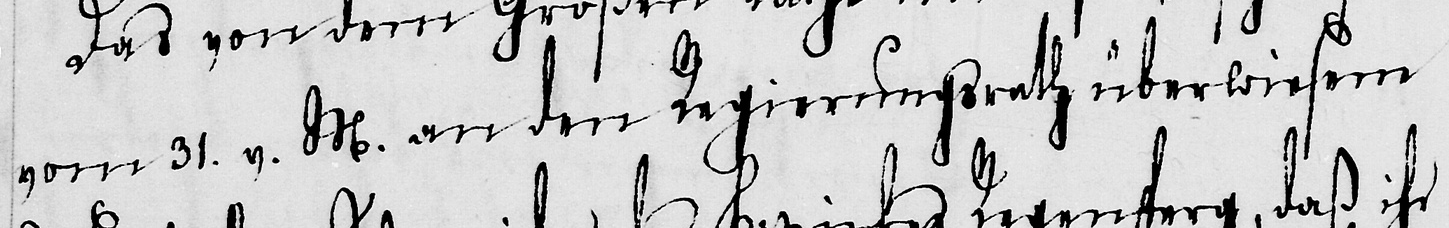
vom 31. v. M. an den Regierungsrath überwiesene
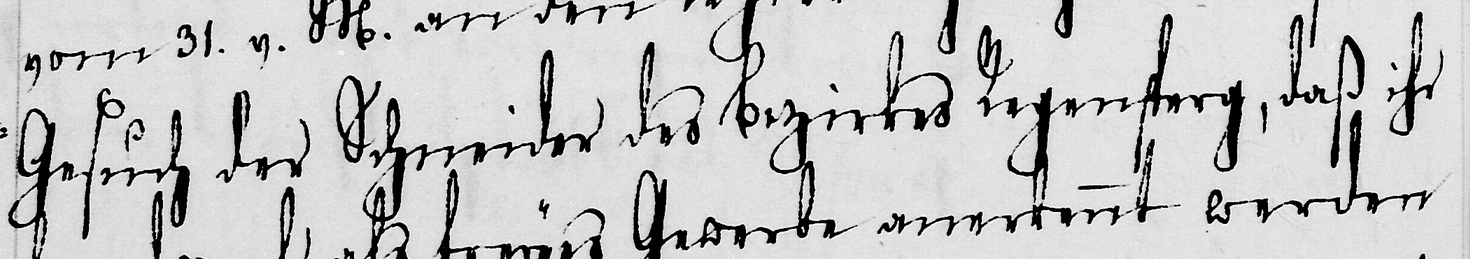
Gesuch der Schneider des Bezirkes Regensperg, daß i¬
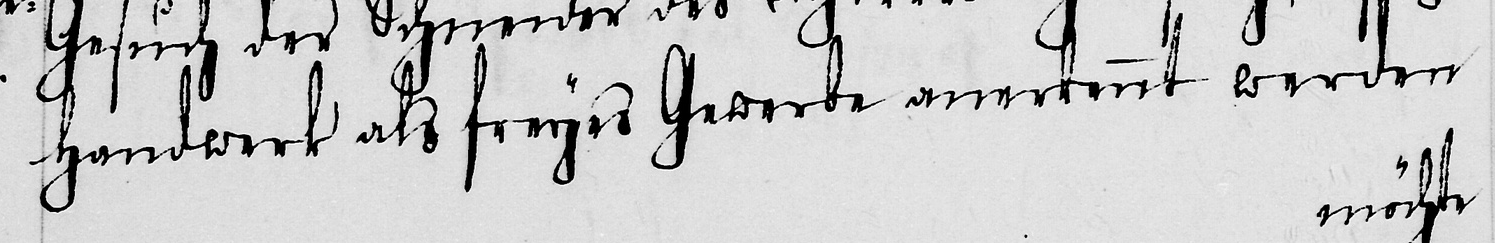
Handwerk als freyes Gewerbe anerkennt werden
